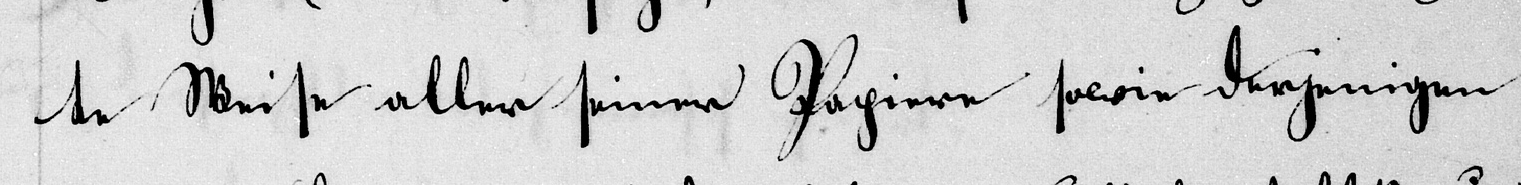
te Weise aller seiner Papiere sowie derjenigen
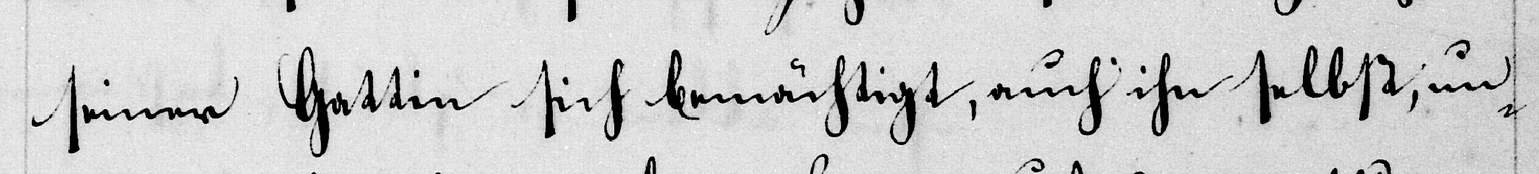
seiner Gattin sich bemächtigt, auch ihn selbst, un¬
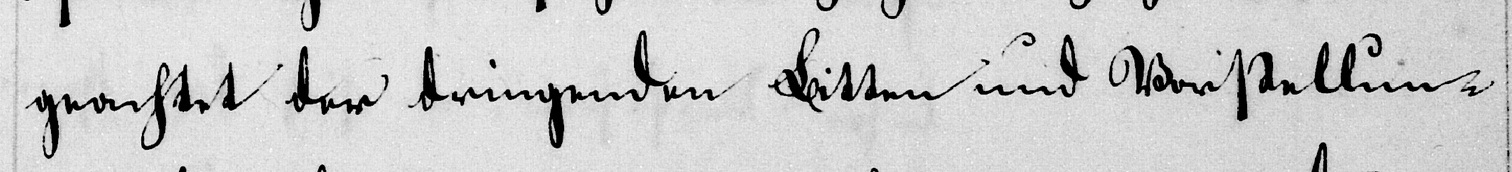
geachtet der dringenden Bitten und Vorstellun¬
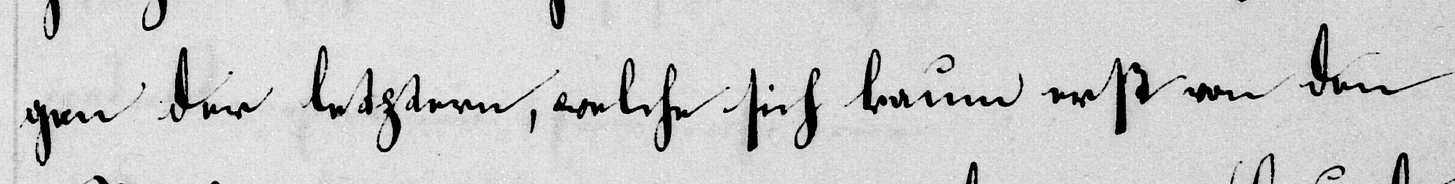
gen der letztern, welche sich kaum erst von den
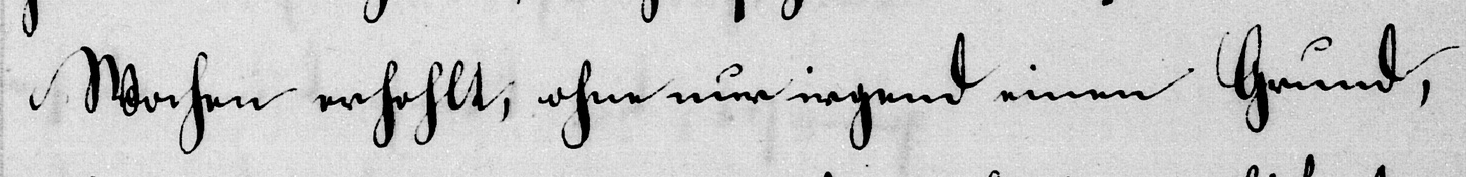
Wochen erhohlt, ohne nur irgend einen Grund,
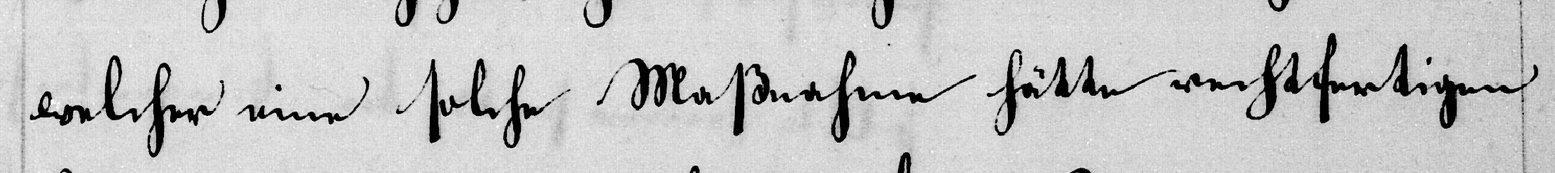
welcher eine solche Maßnahme hätte rechtfertigen
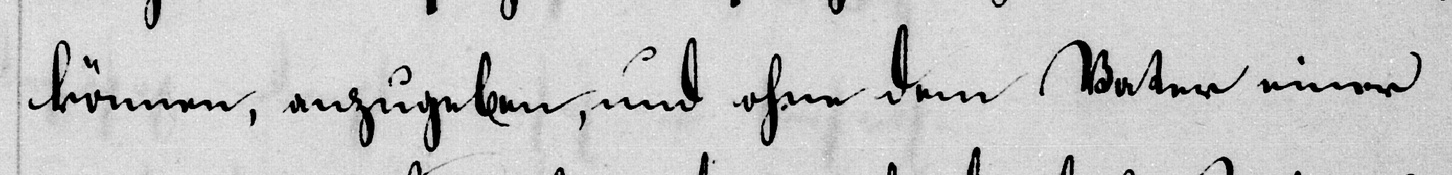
können, anzugeben, und ohne dem Vater einer
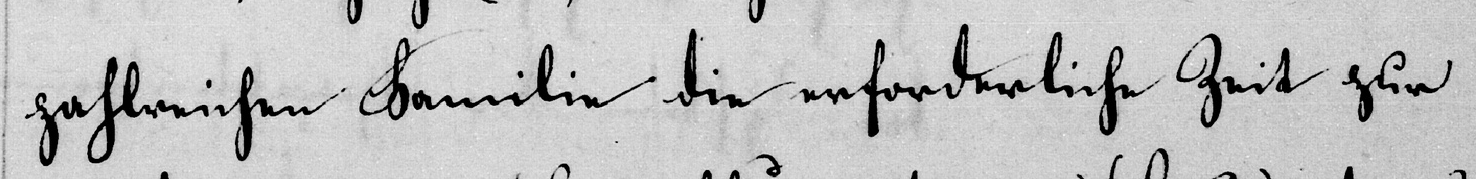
zahlreichen Familie die erforderliche Zeit zur
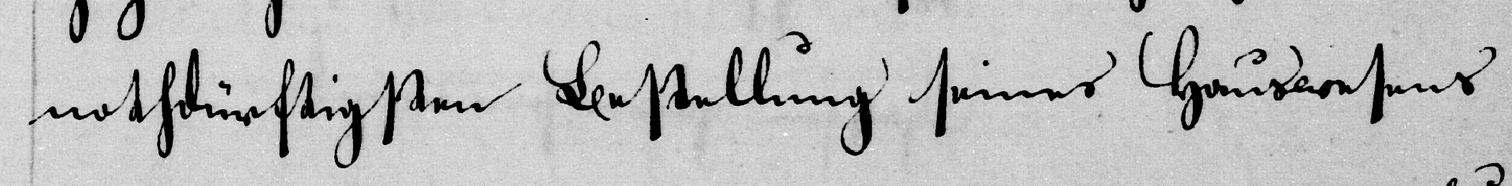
nothdürftigsten Bestellung seines Hauswesens
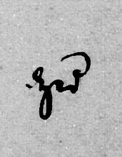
zur
